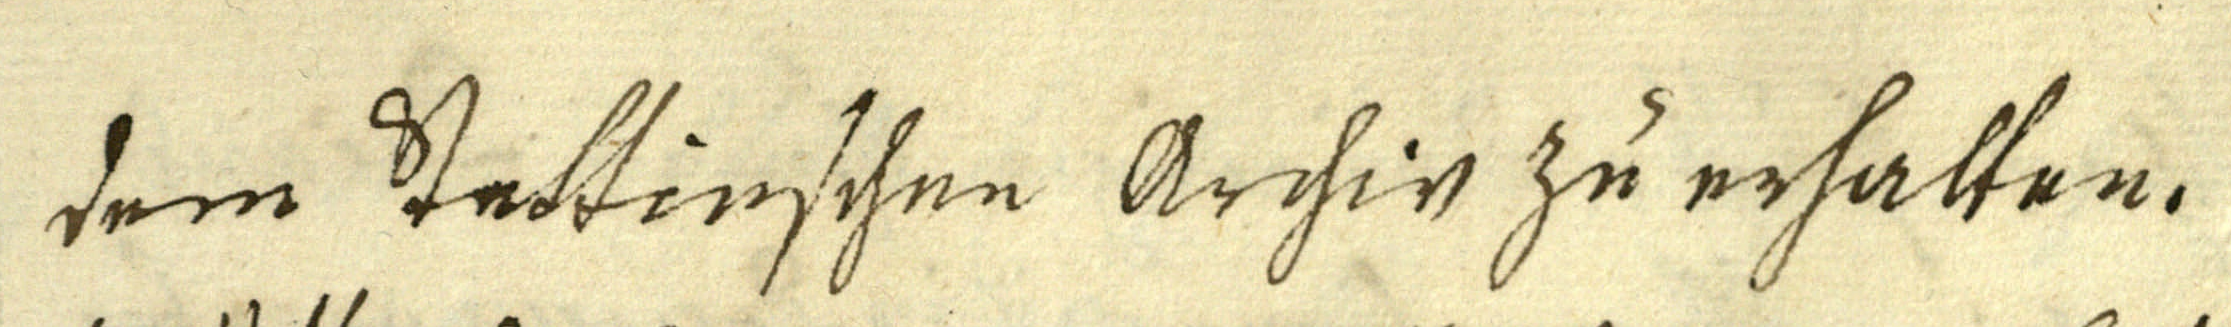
dem Stettinschen Archiv zu erhalten.
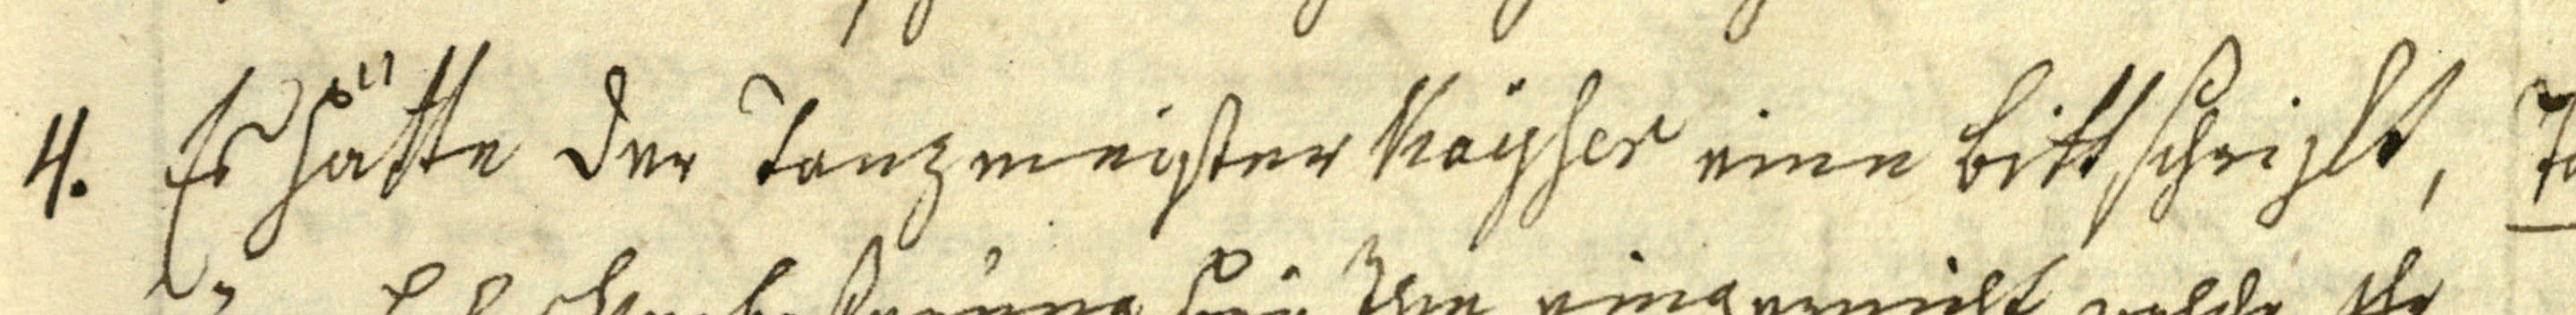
4. Es hätte der Tanzmeister Kaÿser eine Bittschrift,
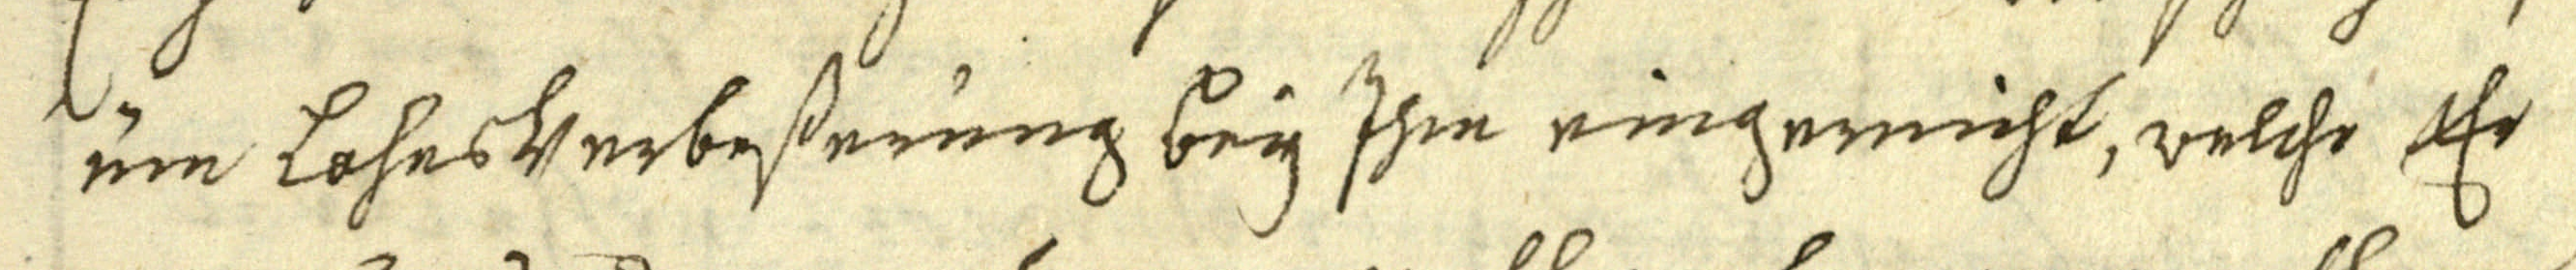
um Lohnsverbeßerung beÿ Ihm eingereicht, welche Er
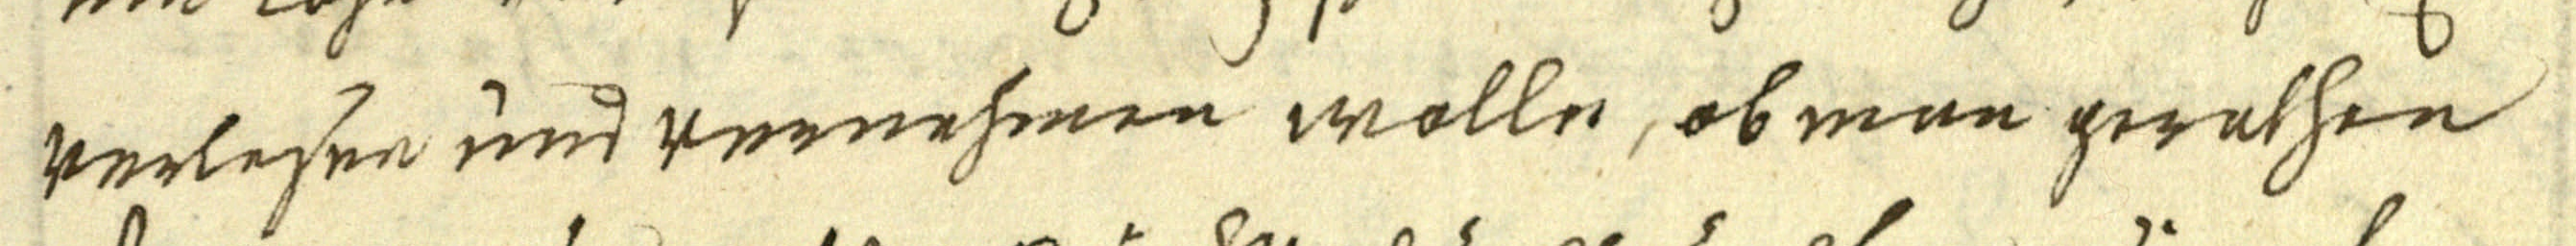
verlesen und vernehmen wolle, ob man gerathen
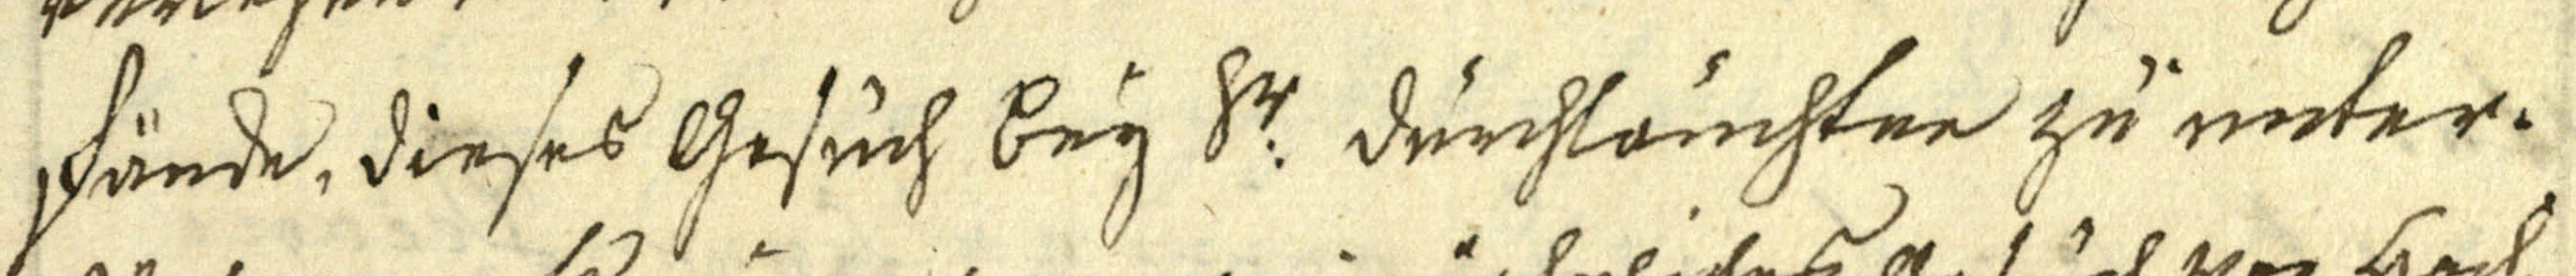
fände, dieses Gesuch beÿ Sr Durchlauchten zu unter¬
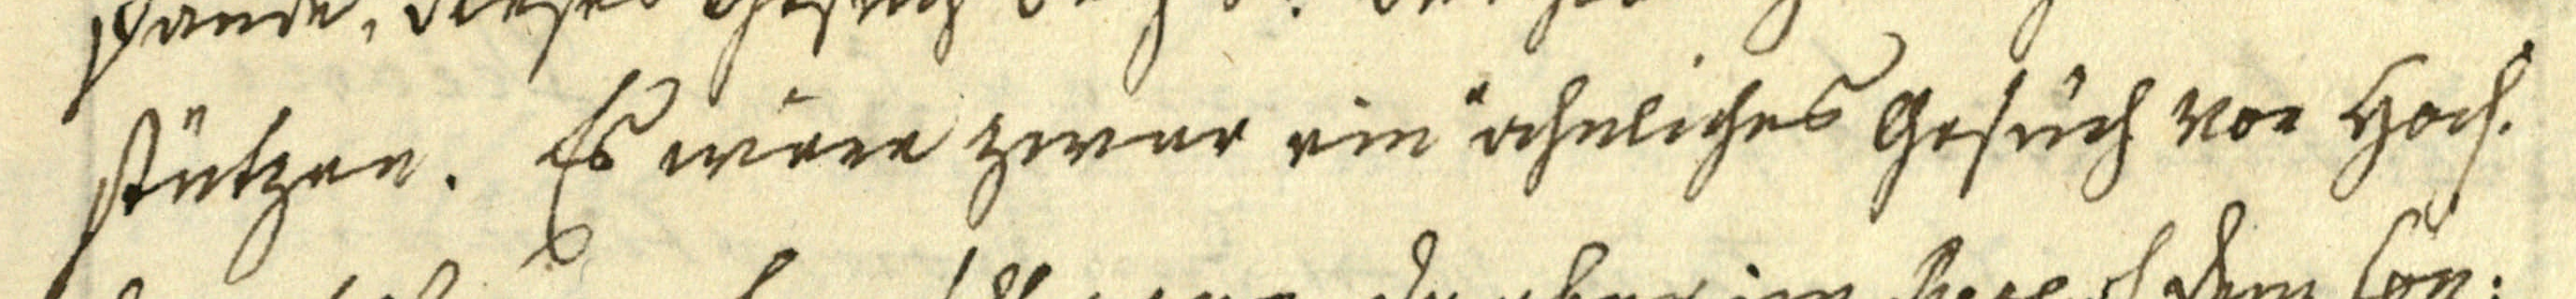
stützen. Es wäre zwar ein ähnliches Gesuch von Hoch¬
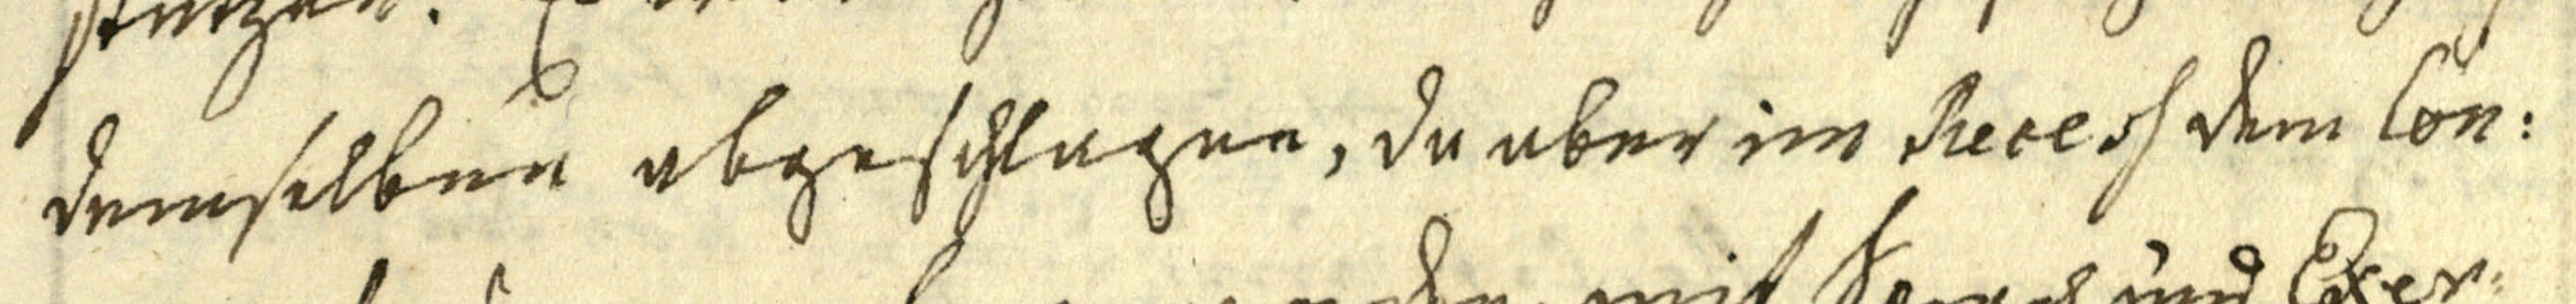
demselben abgeschlagen, da aber im Recess dem Con¬
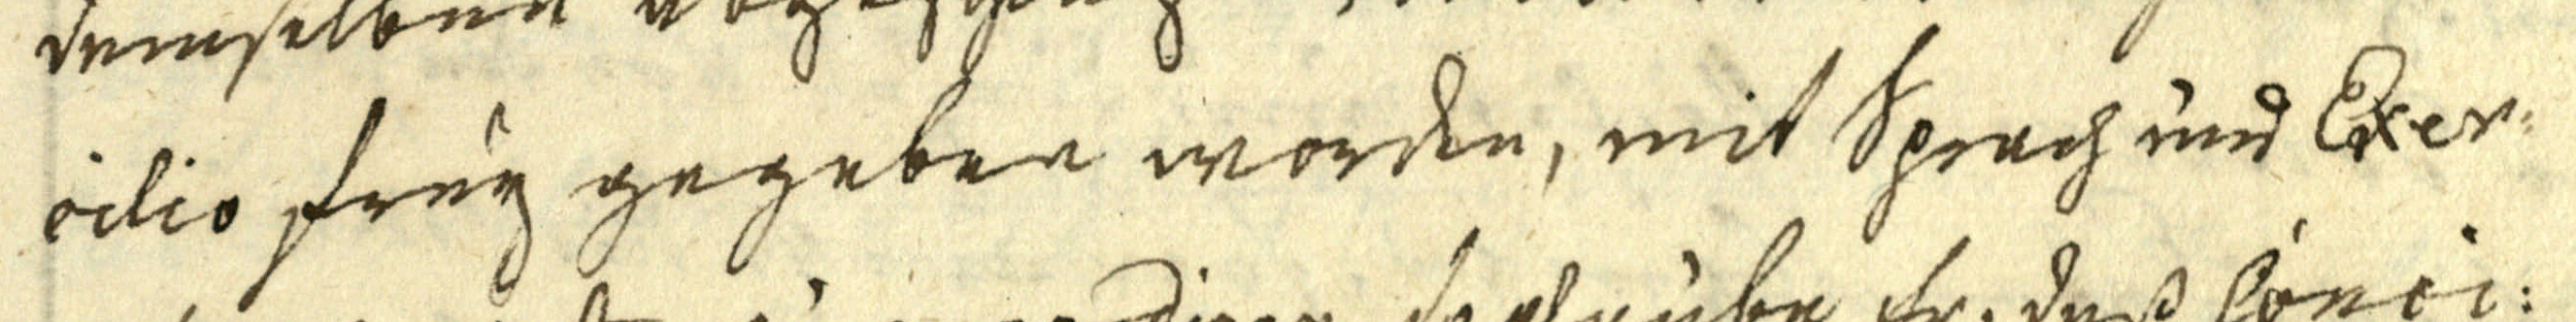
cilio freÿ gegeben worden, mit Sprach und Exer¬
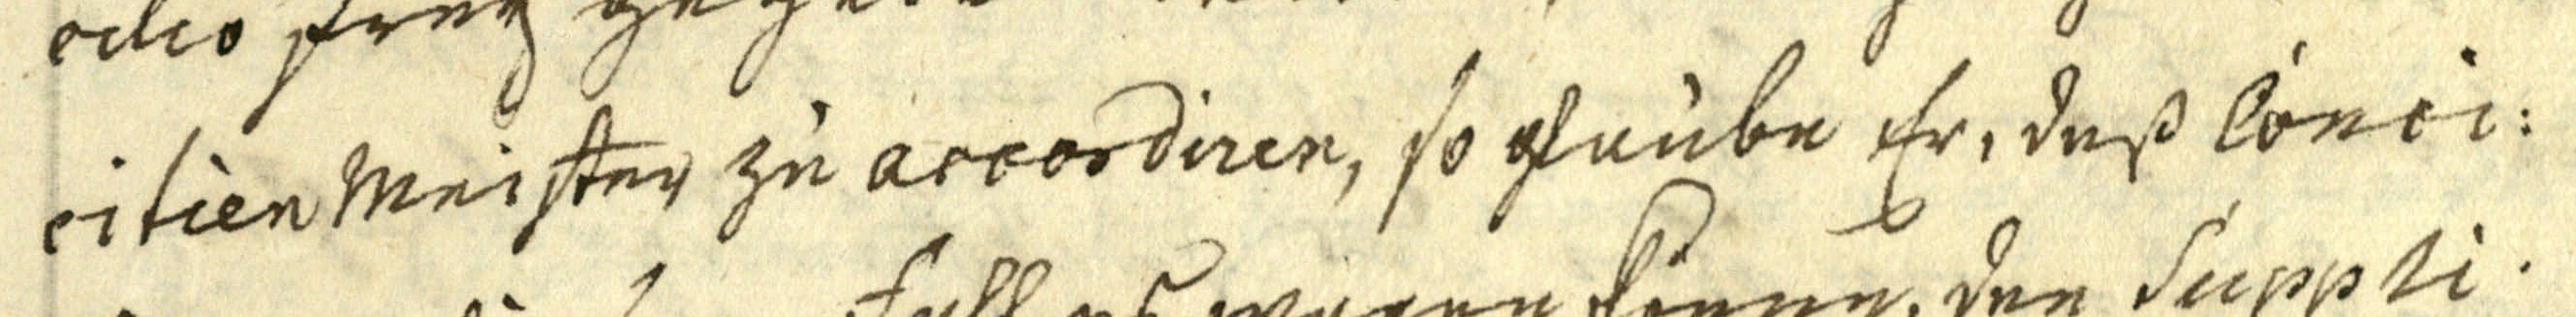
citien Meister zu accordiren, so glaube Er, daß Conci¬
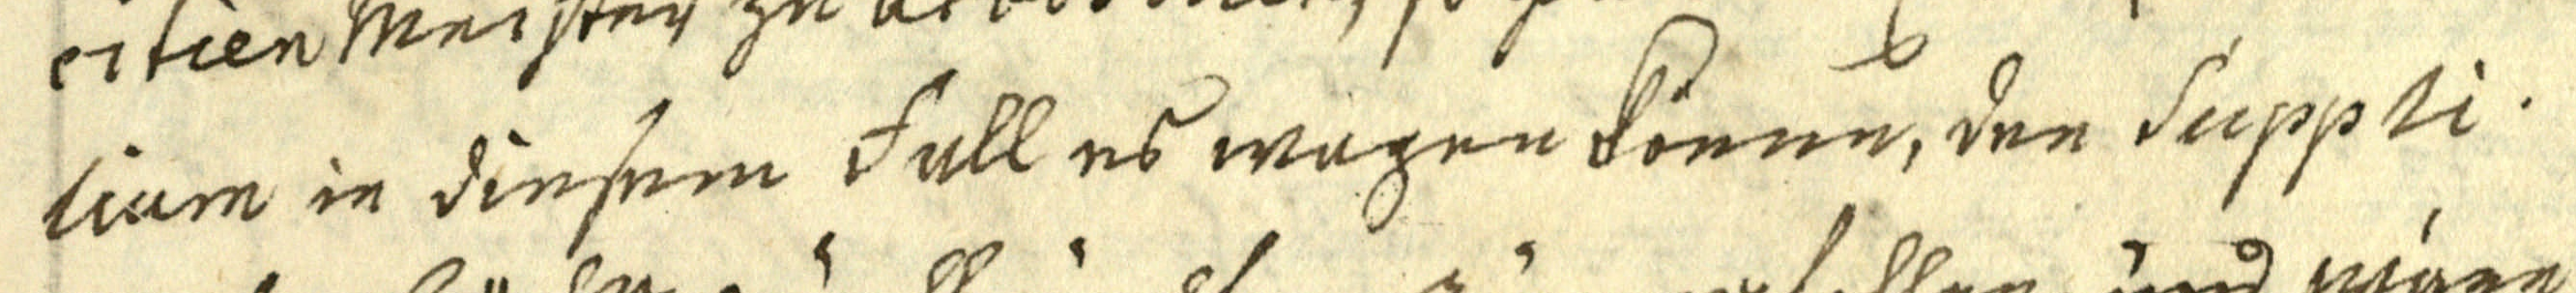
lium in diesem Fall es wagen könne, den Suppli¬
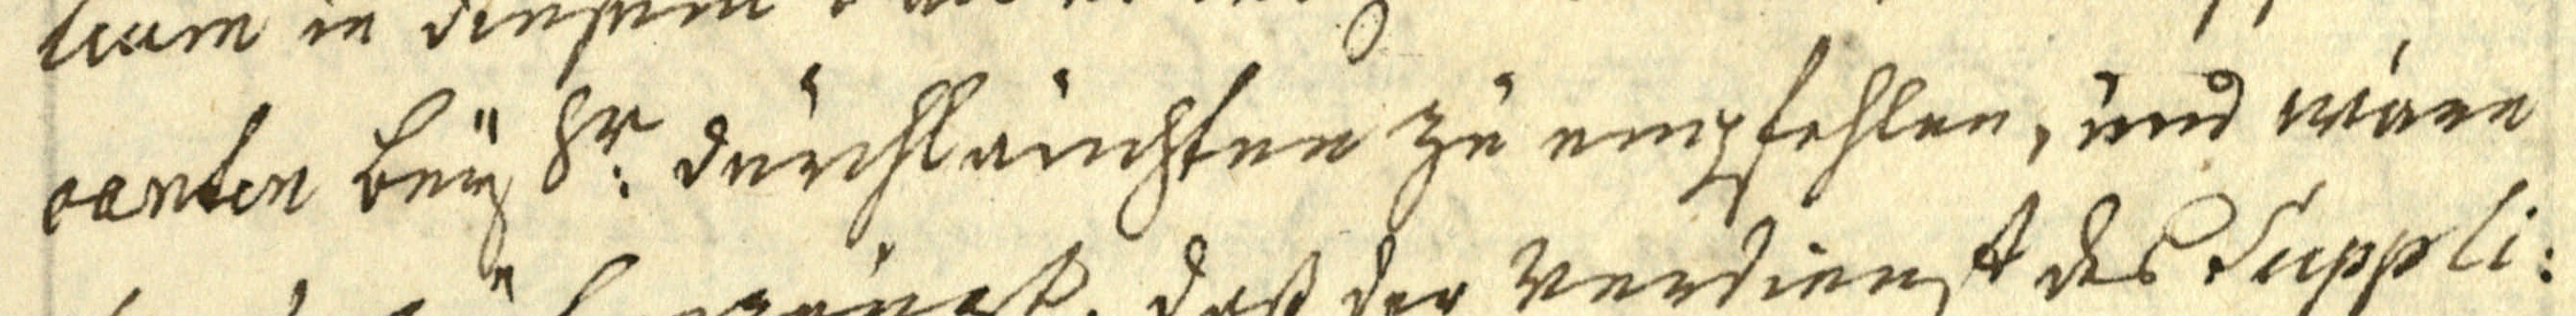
canten beÿ Sr. Durchlauchten zu empfehlen, und wäre
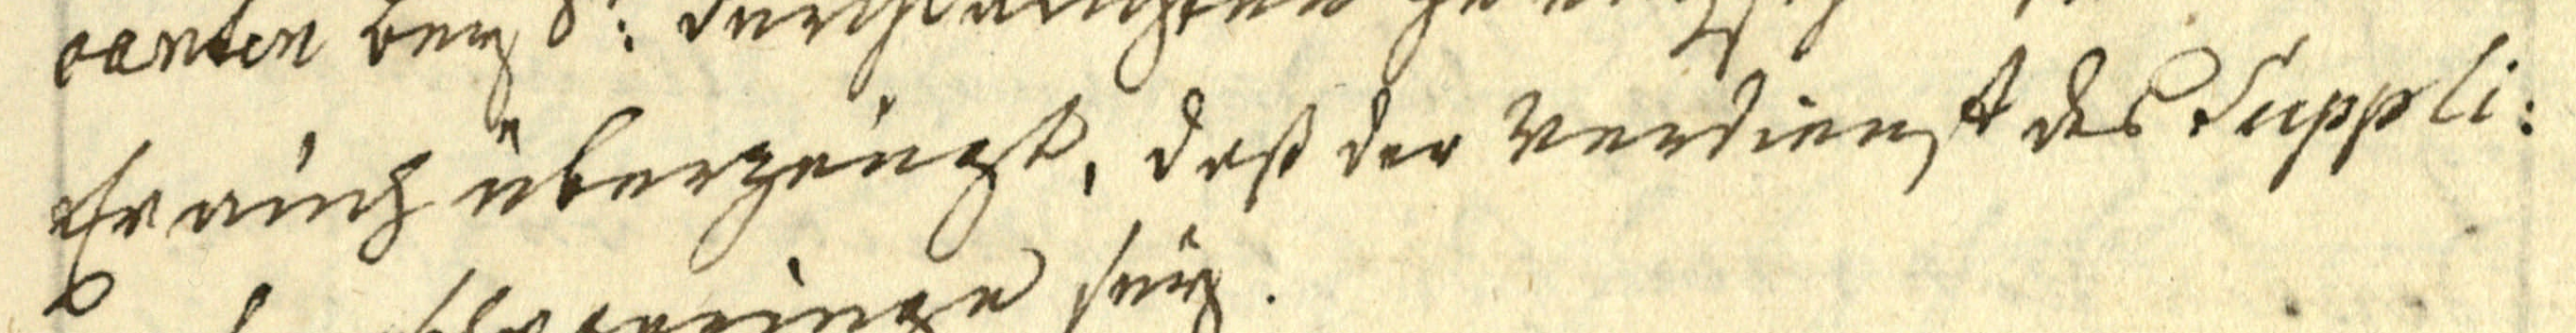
Er auch überzeugt, daß der Verdienst des Suppli¬
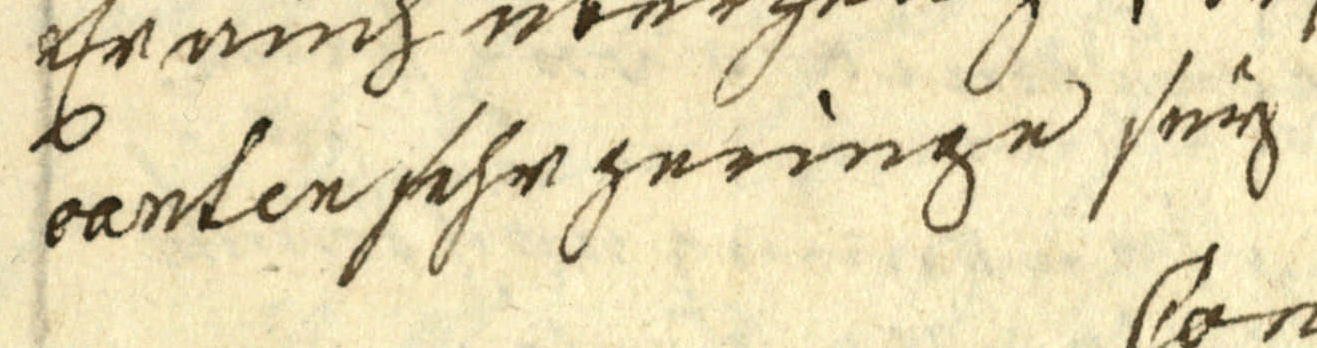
canten sehr geringe seÿ.
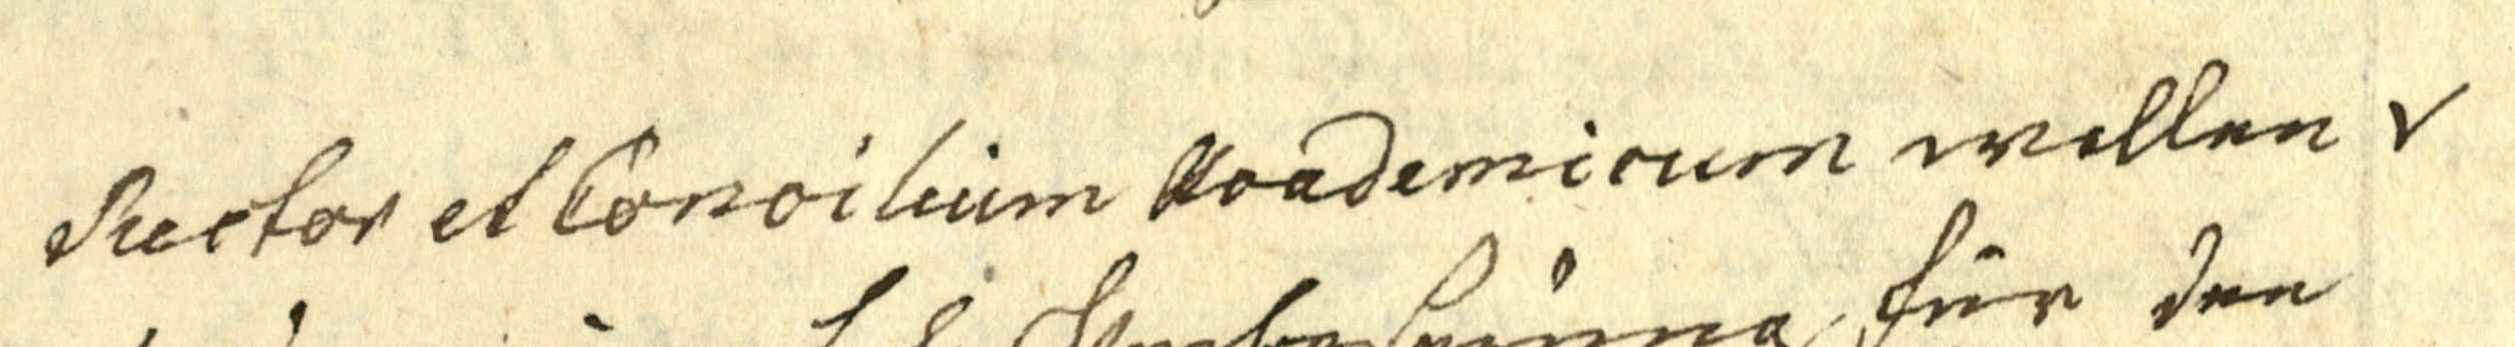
Rector et Concilium Academicum wollen
